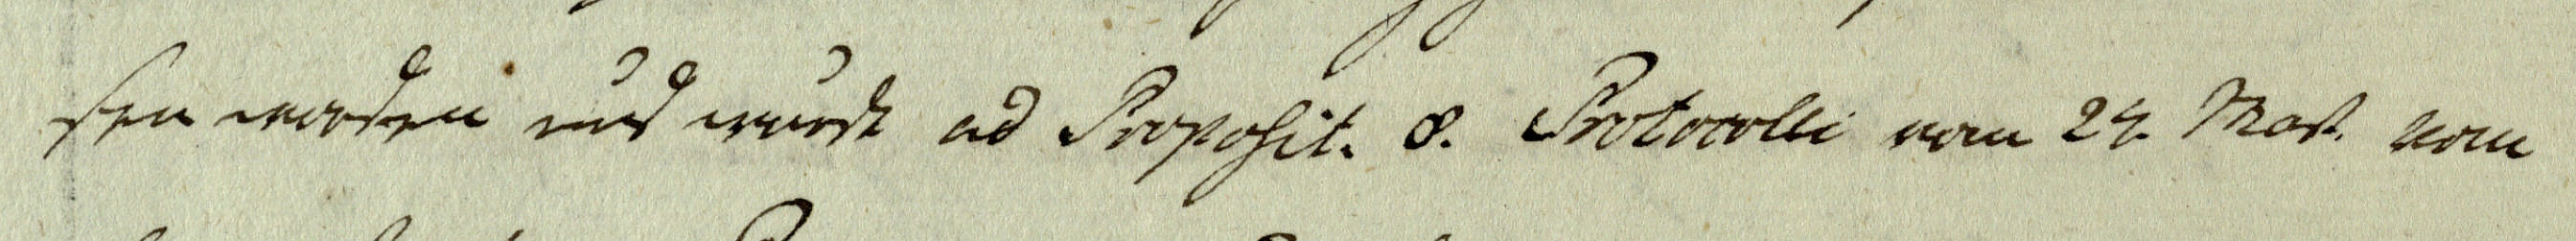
sen worden und wurde ad Proposit. 8. Protocolli vom 24. Mart. vom
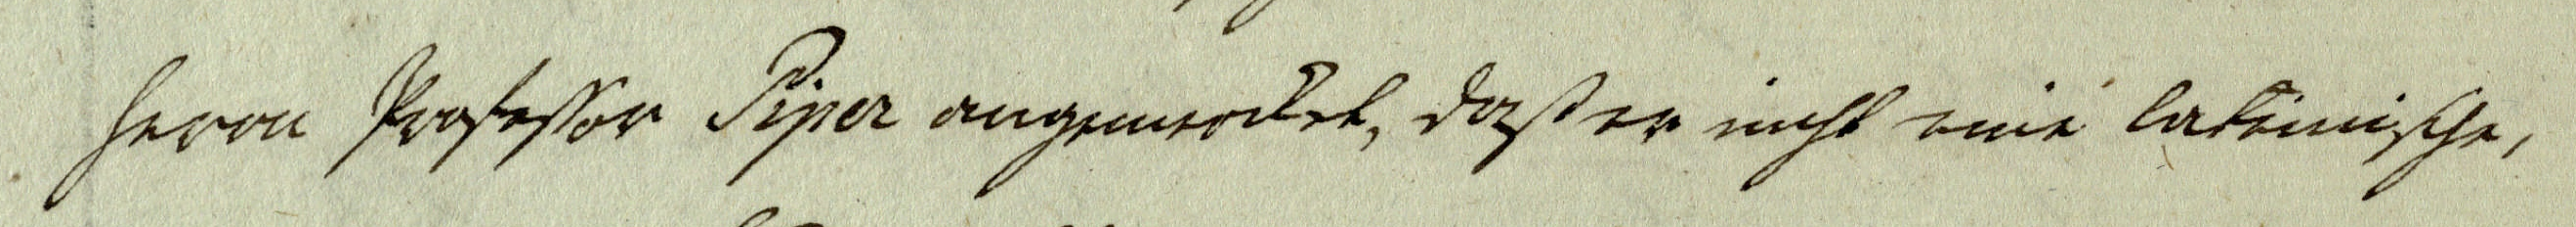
Herrn Professor Piper angemercket, daß er nicht eine lateinische,
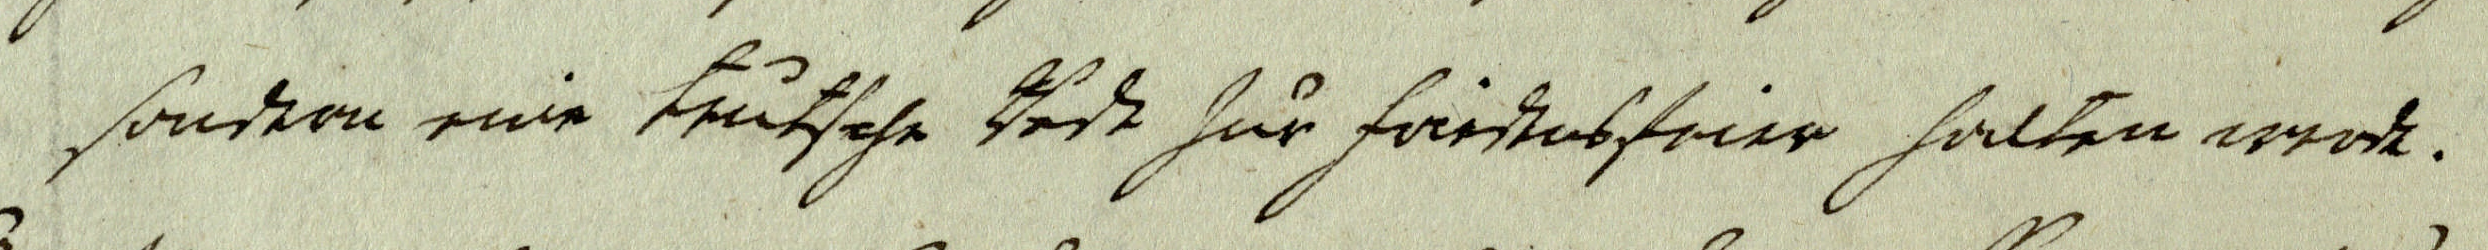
sondern eine teutsche Rede zur Friedensfeier halten werde.
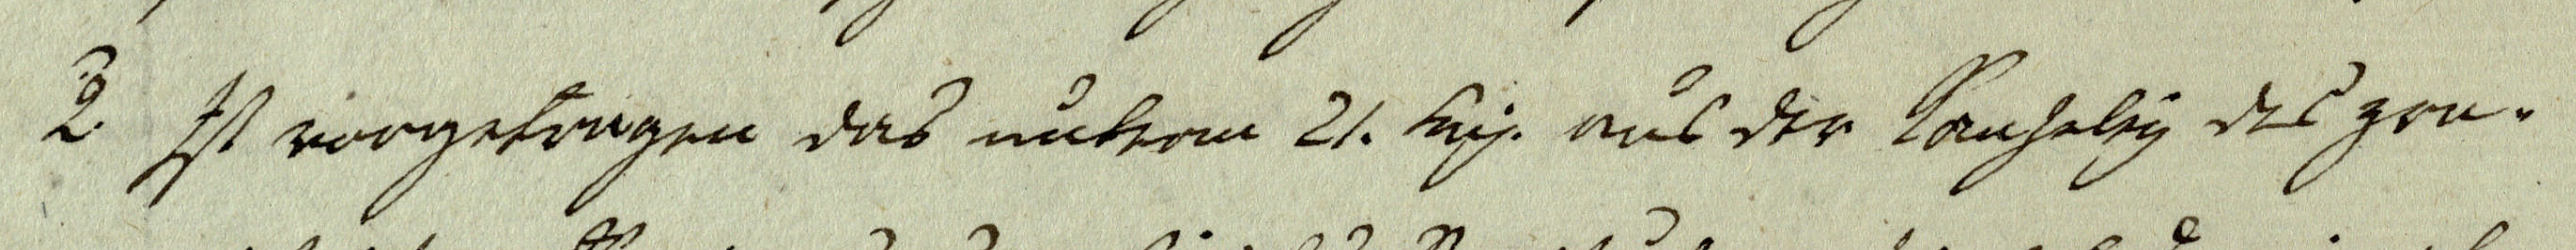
2. Ist vorgetragen das unterm 21. huj. aus der Kanzeleÿ des pro¬
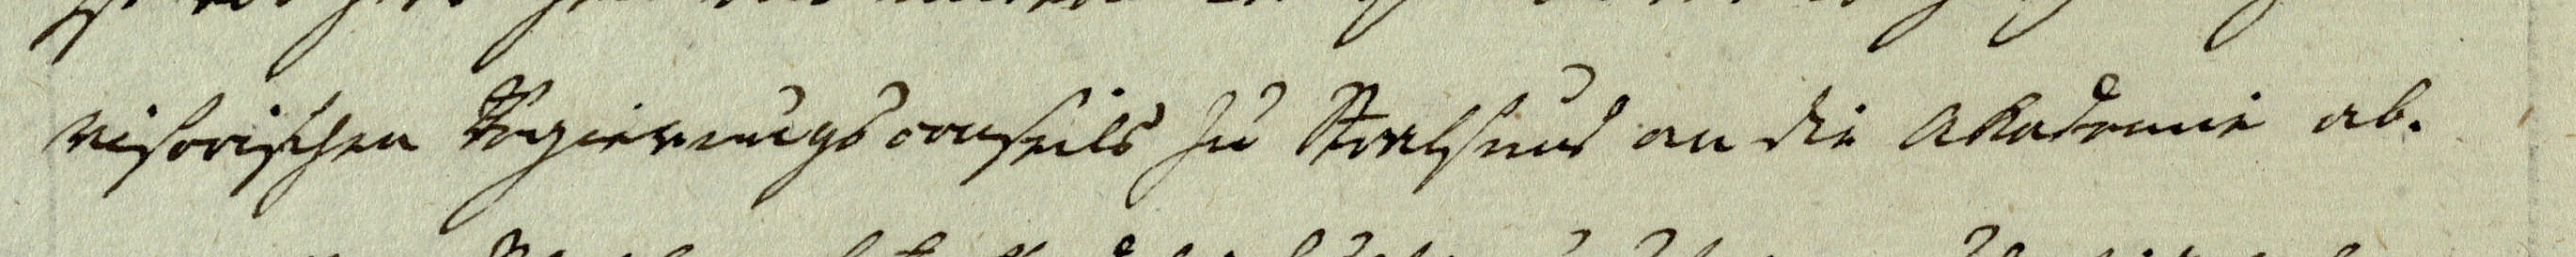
visorischen Regierungs conseils zu Stralsund an die Akademie ab¬
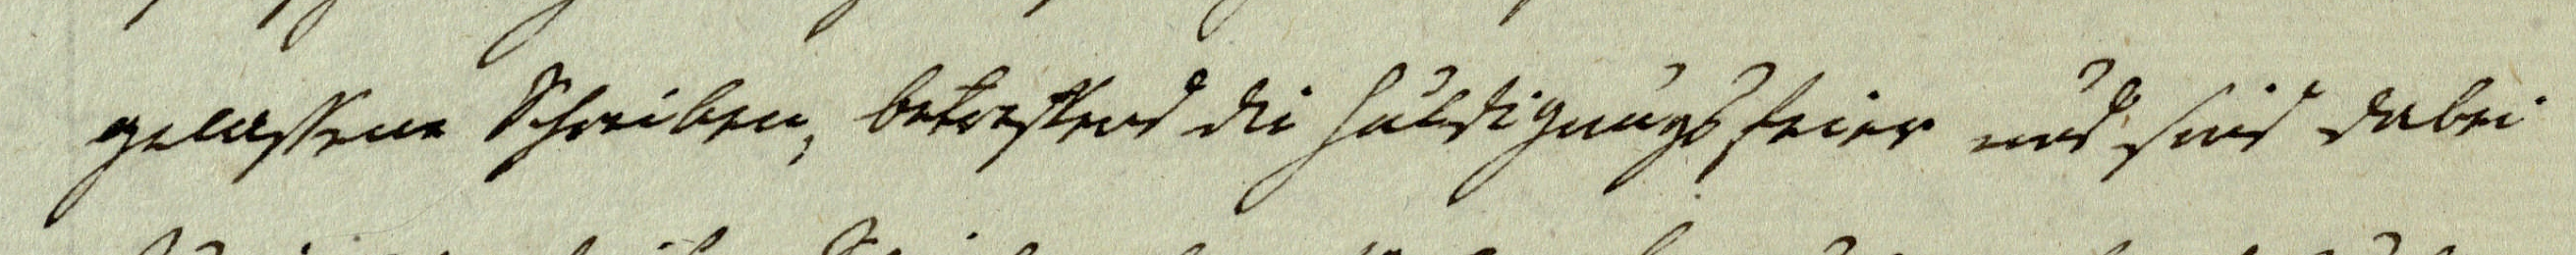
gelassene Schreiben, betreffend die Huldigungsfeier und sind dabei
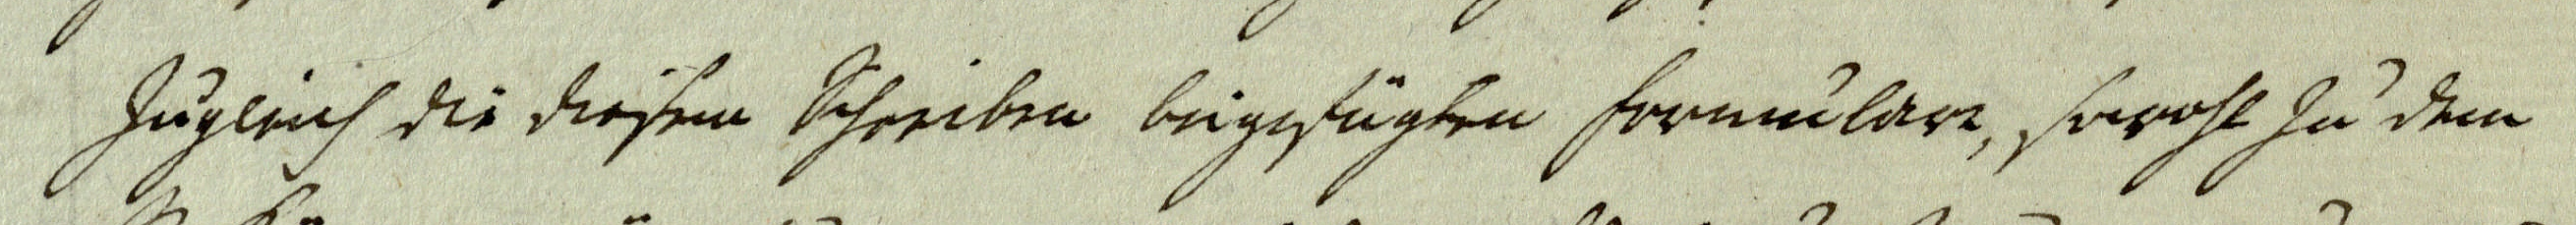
zugleich die diesem Schreiben beigefügten Formulare, sowohl zu dem
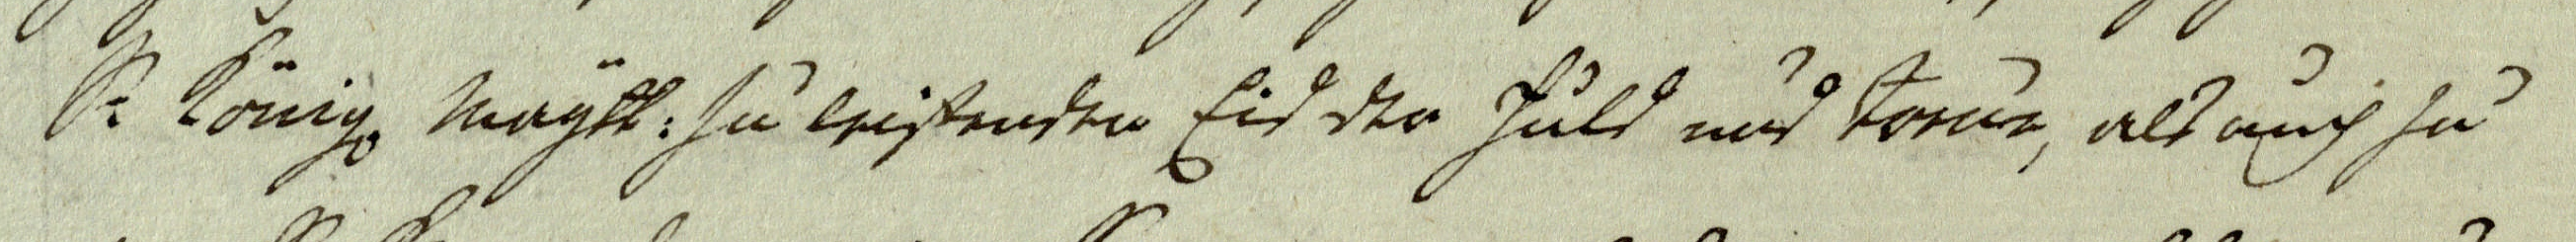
Sr König. Maÿtt zu leistenden Eid der Huld und Treue, als auch zu
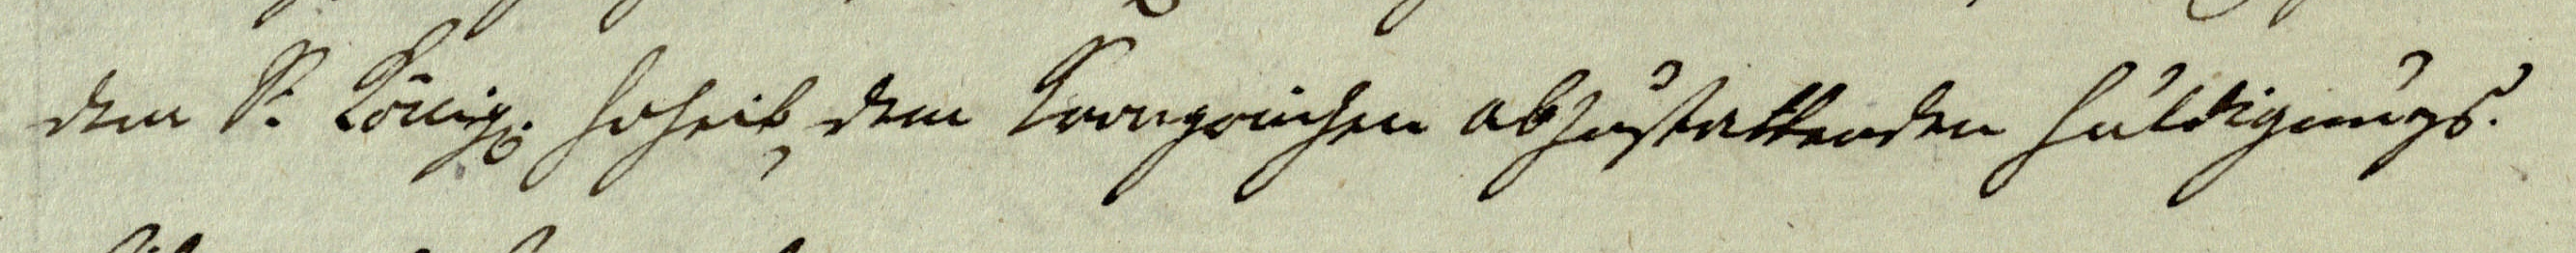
dem Sr. König. Hoheit dem Kronprinzen abzustattenden Huldigungs¬
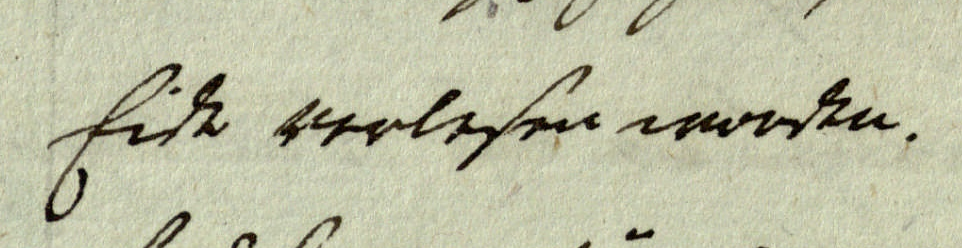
Eide verlesen worden.
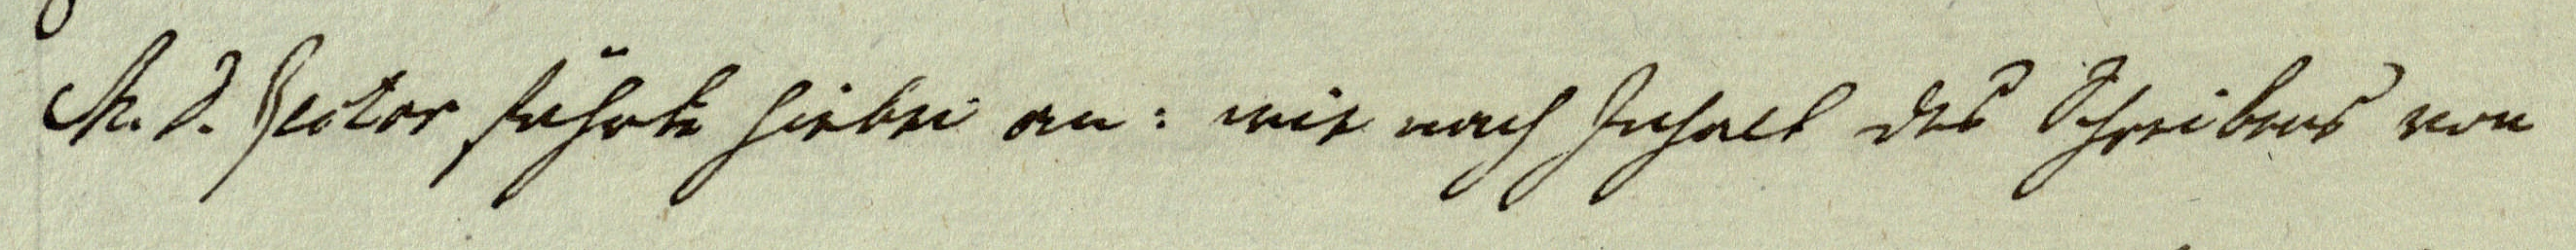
M. D. Rector führte hiebei an: wie nach Inhalt des Schreibens von
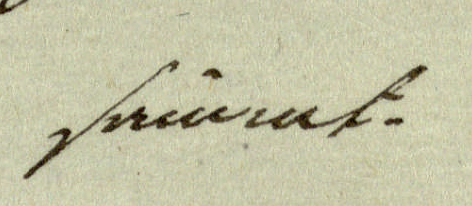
sämmt¬
